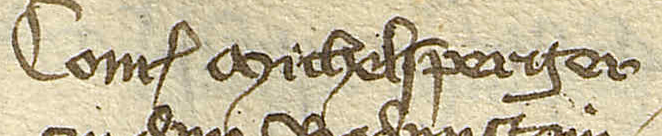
Conr* Michelſperger
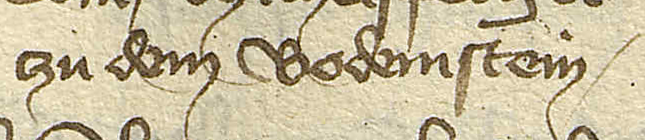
cʒu dem Bodemſtein /
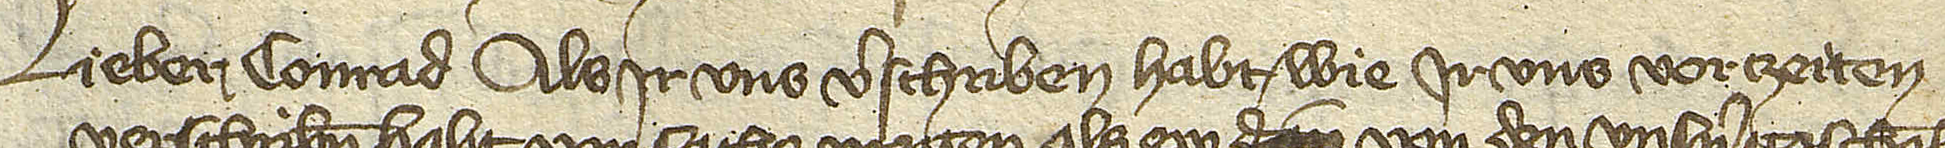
Lieber Conrad Als Ir vns v*ſchriben habt / wie Ir vns vorcʒeiten
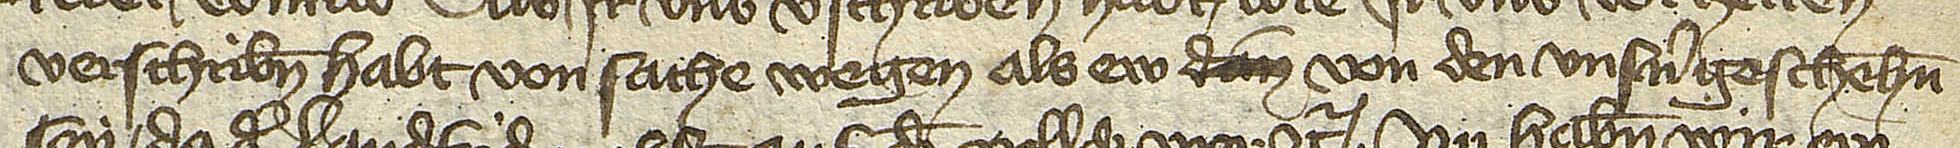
verſchribn* habt von ſache wegen als ew dan* von den vnſn* geſchehn*
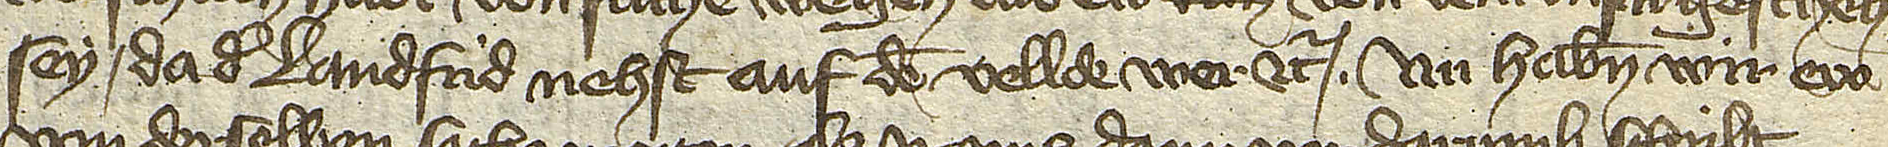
ſey / da d* Landfrid nehſt auf de* vellde wer . ec* / . Nu habn* wir ew
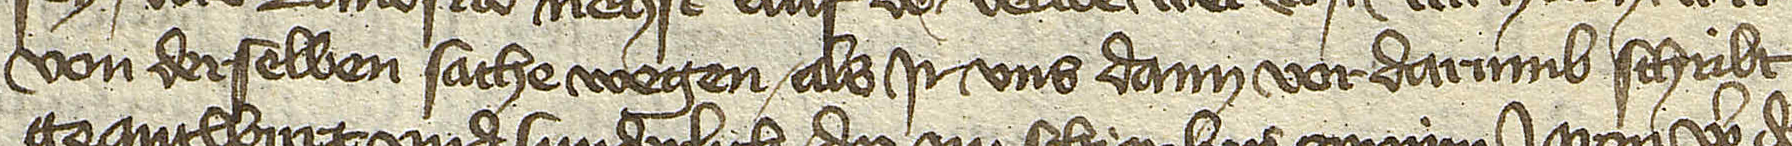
von derſelben ſache wegen / als Ir vns dann vor darumb ſchribt
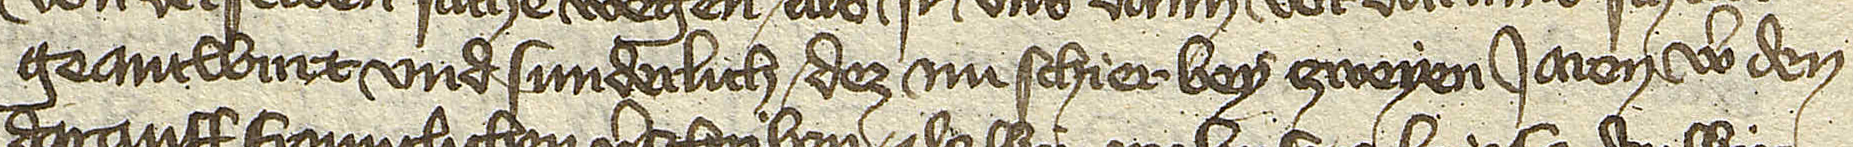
geantwurt vnd ſunderlich / deʒ nu ſchier bey cʒweyen Iaren w*den
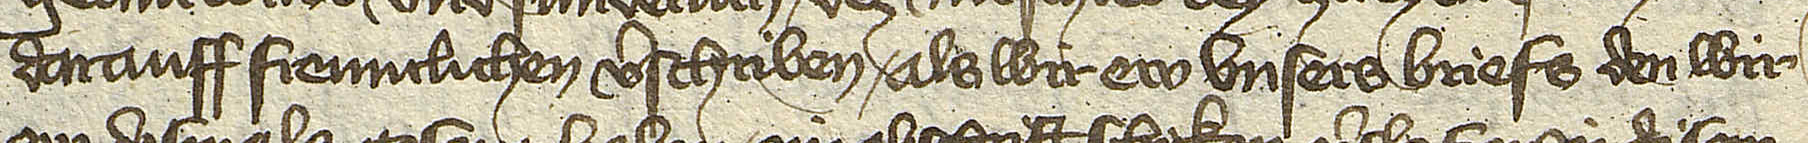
darauff freuntlichen v*ſchriben / als wir ew vnſers briefs den wir
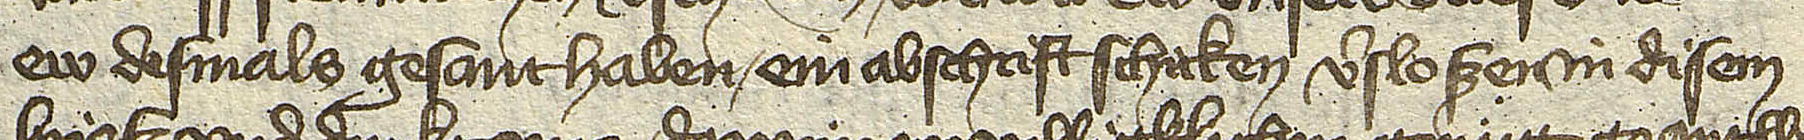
ew deſmals geſant haben / ein abſchrift ſchicken v*ſloſʒen in diſem
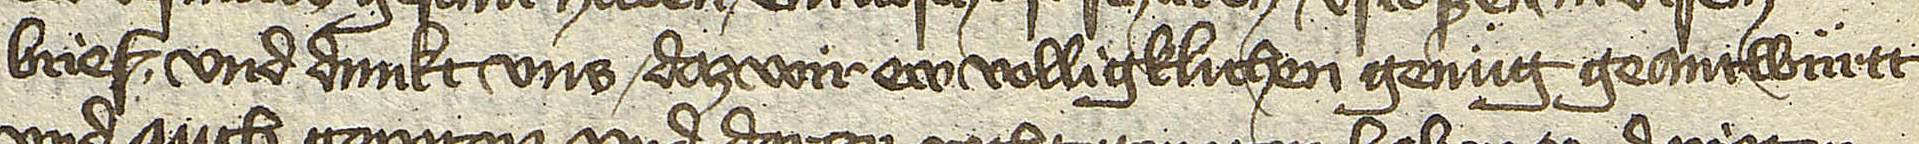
brief . vnd dunkt vns / daʒ wir ew volligklichen genüg geantwürtt
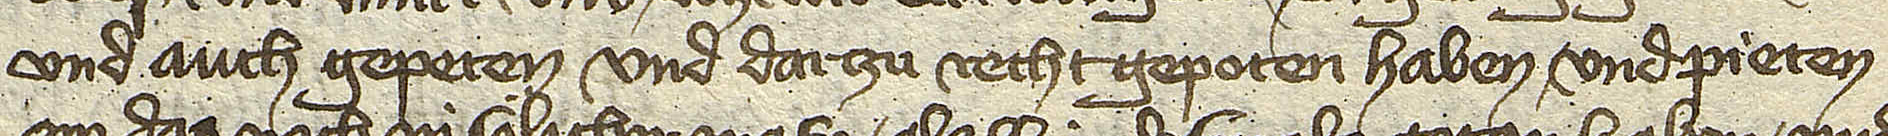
vnd auch gepeten vnd darcʒu recht geporen haben / vnd pieten
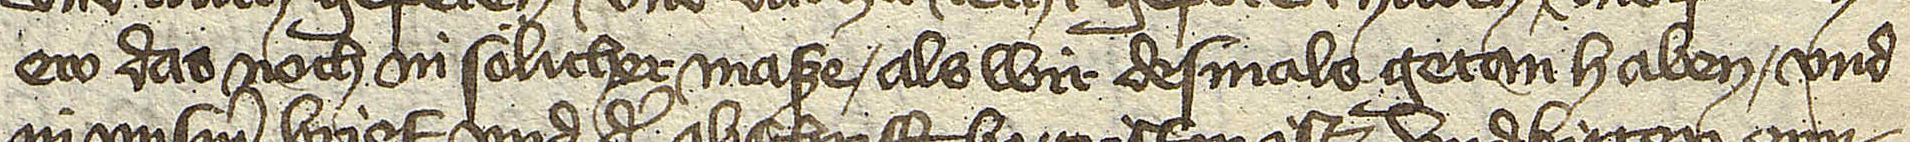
ew das noch in ſölicher maſʒe / als wir deſmals getan haben / vnd
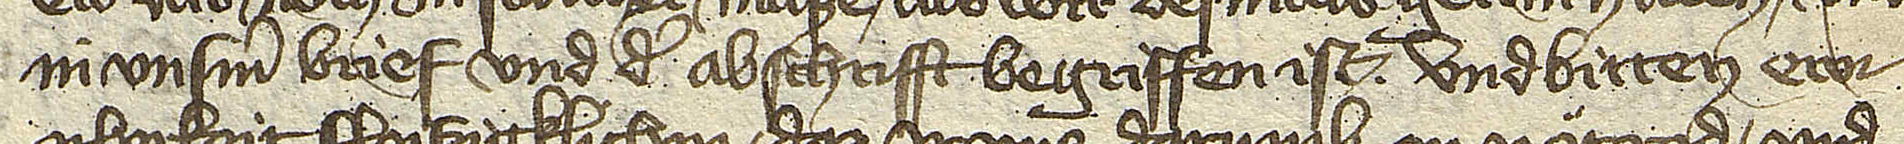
in vnſm* brief vnd d* abſchrift begriffen iſt / . vnd bitten ewr
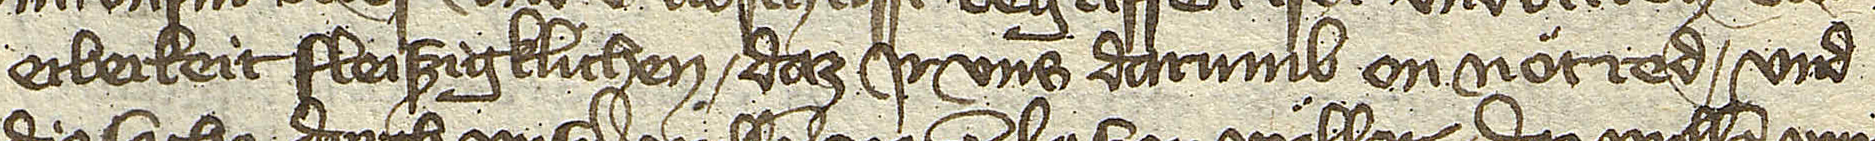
erberkeit fleiſʒigklichen / daʒ Ir vns darumb on nötred / vnd
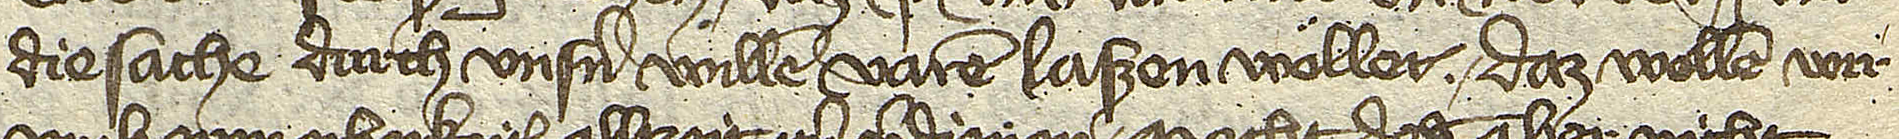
die ſache durch vnſn* wille* vare* laſʒen wöllet . / daʒ wolle* wir
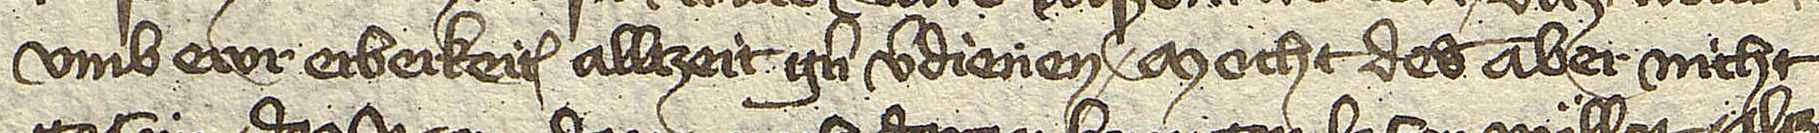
vmb ewr erberkeit* allcʒeit gn* v*dienen / Mocht des aber nicht
